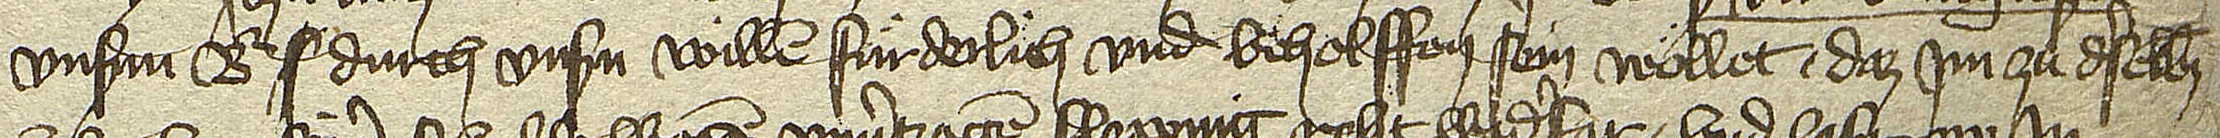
vnſ*m B* durch vnſ*n wille* fürderlich vnd beholffen ſein wöllet / daʒ Im cʒu d*ſelbn*
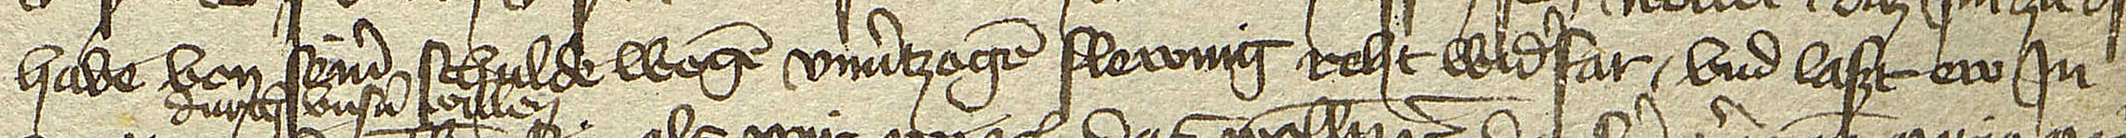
habe von ſein* ſchulde wege*vnu*tʒoge* ſlewnig reht wid*far / vnd laſʒt ew In
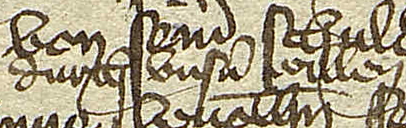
durch vnſn* willen
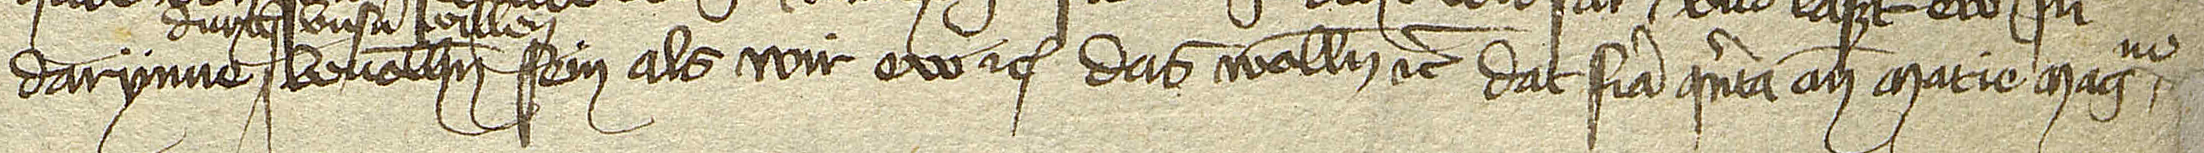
darynne beuolhn* ſein als wir ew ec* das wolln* ec* dat fia* qnta* an* Marie Mag* /
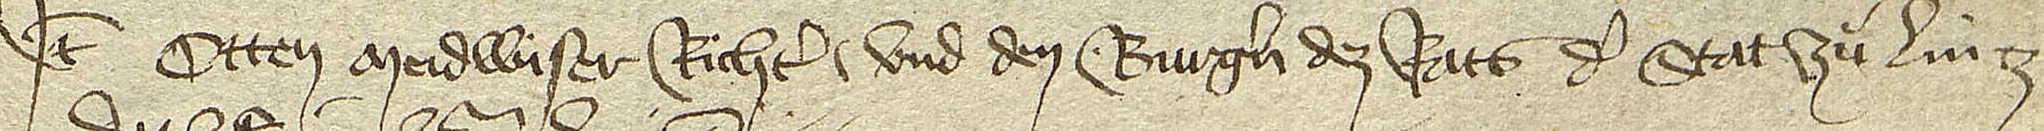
It* Otten Meidwiſer Richt* / vnd den Burg*n deʒ Rats* d* Stat cʒü Lincʒ
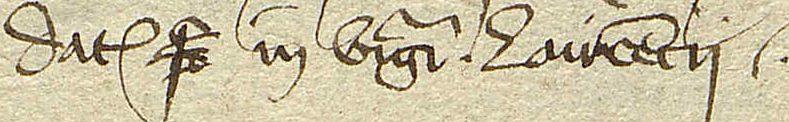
Dat* %% in vigi* . Laurecii* / .
